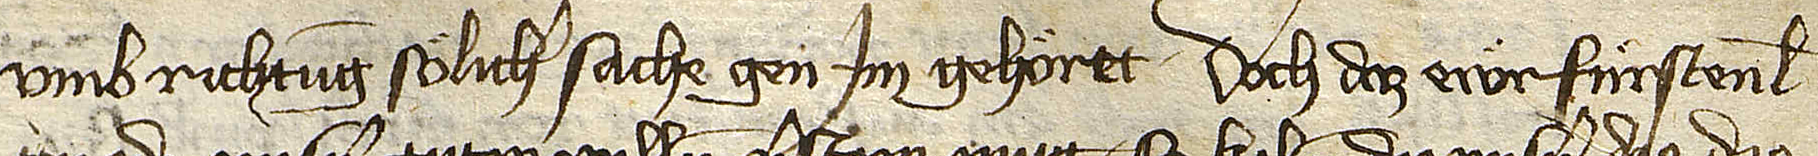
vmb richtu*g ſölich* ſache gen Im gehöret / Doch daʒ eẅr fürſtenl*
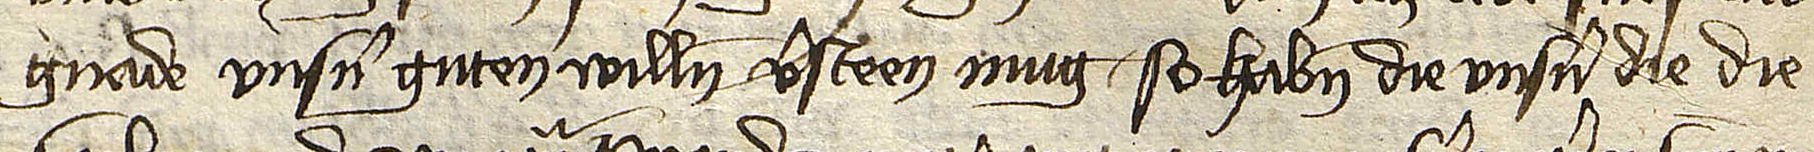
gnade vnſn* guten willn* v*ſteen mug / ſo habn* die vnſn* die die
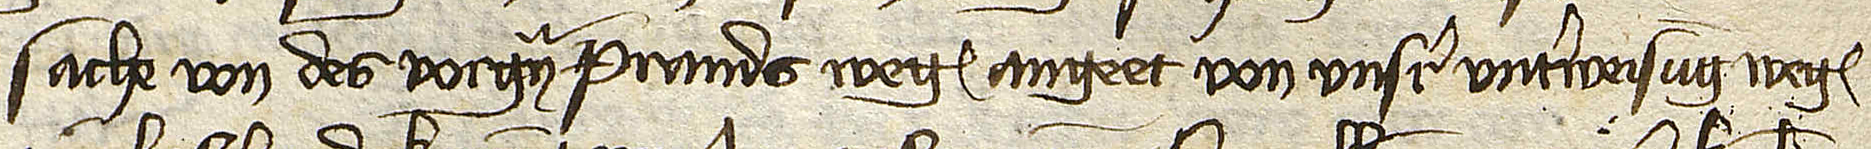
ſache von des vorgn* Prands weg* angeet von vnſr* vnt*weiſu*g weg*
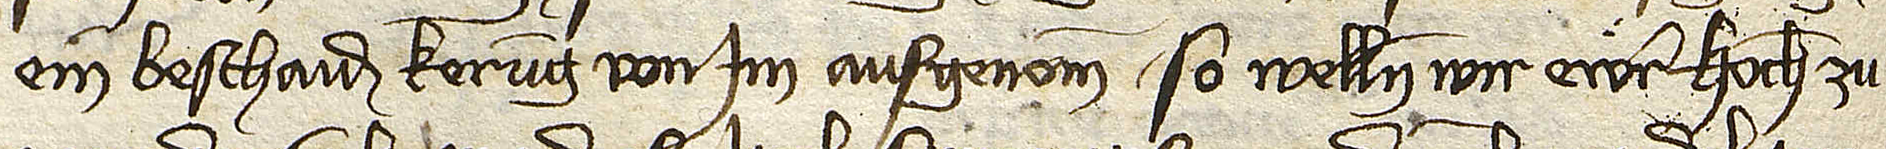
ein beſchaid* keru*g von Im aufgenom* / ſo welln* wir eẅr* Hoch* ʒu
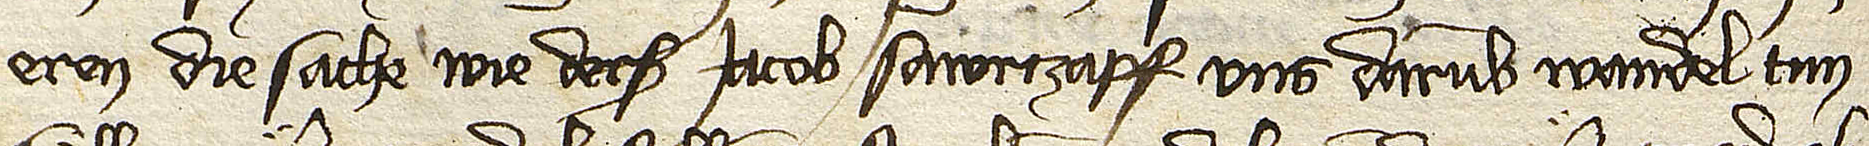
eren die ſache wie derſ* Iacob ſawrcʒapf vns darub* wandel tun
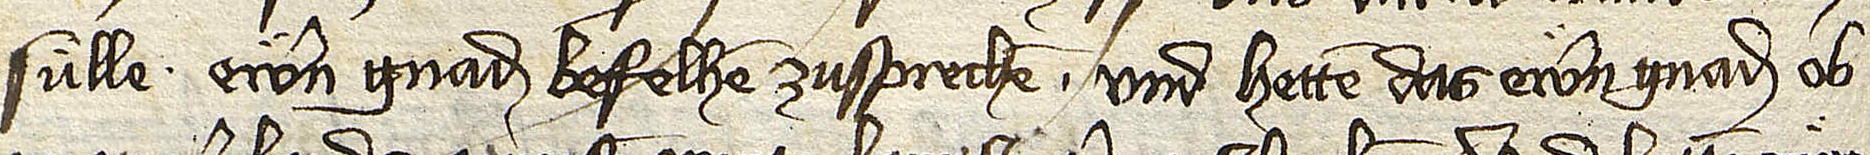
ſülle . eẅ*n gnad* befelhe* ʒuſpreche* . vnd hette* das eẅ*n gnad* ob
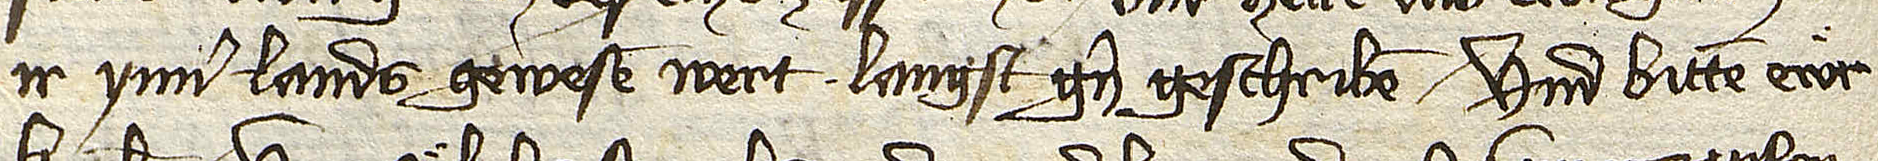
ir ynn* lands geweſe* wert . langſt g*n geſchribe* / Vnd bitte* eẅr
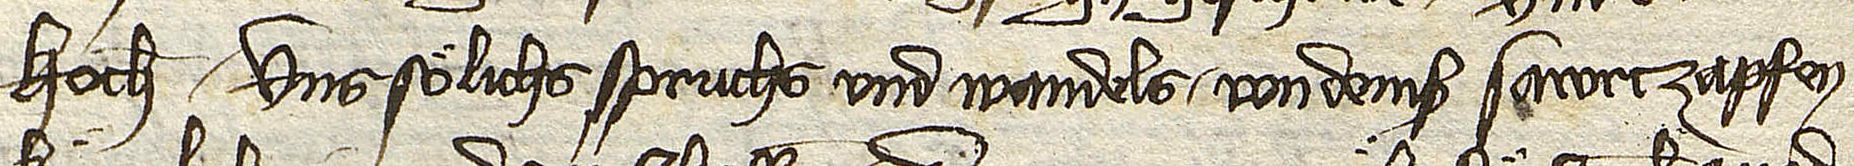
Hoch* / Vns ſölichs ſpruchs vnd wandels / von demſ* ſawrcʒapfen
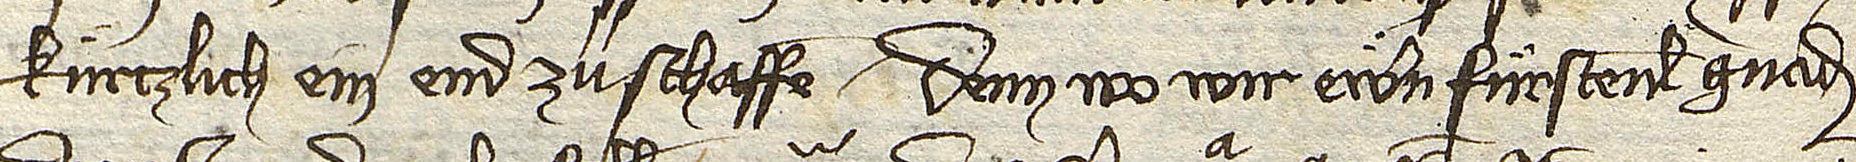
kürcʒlich ein end ʒu ſchaffe* / Denn wo wir eẅ*n fürſtenl* gnad*
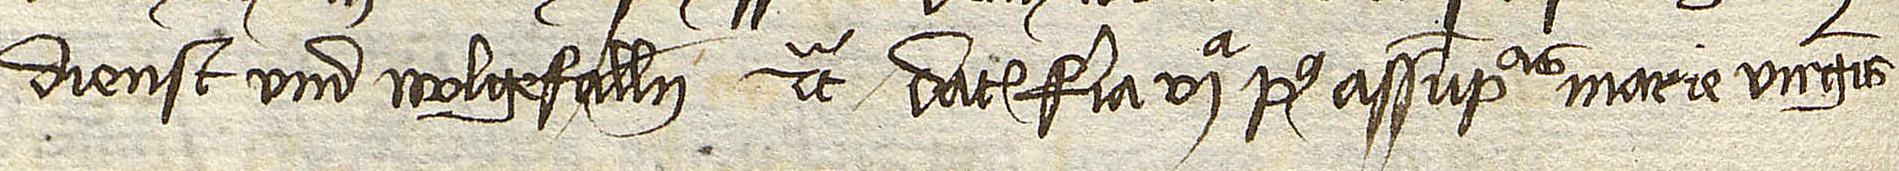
dienſt vnd wolgefalln* ec* / Dat* fi*a vi* p* aſſu*p* marie virg*is
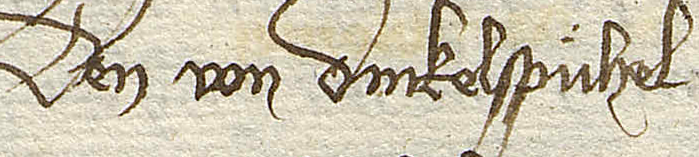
Den von Dinkelſpühel
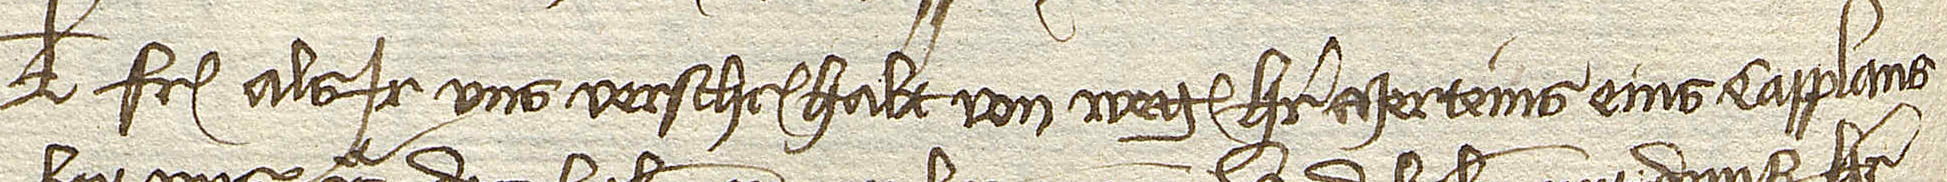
L* fr* als Ir vns verſchr* habt von weg* hr* Merteins eins Capplans
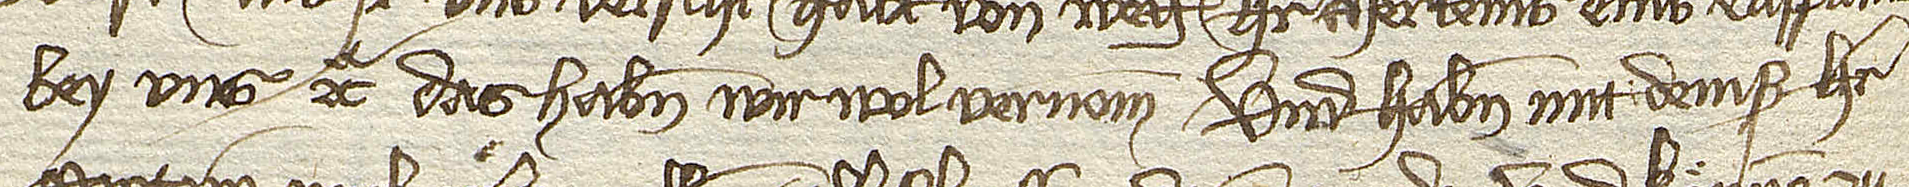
bey vns ec* das habn* wir wol vernom* / Vnd habn* mit demſ* hr*
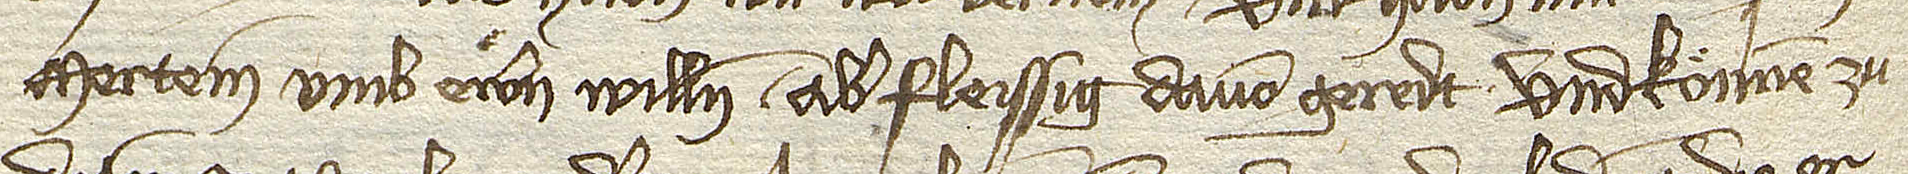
Mertein vmb eẅ*n willn* / ab* fleiſſig dauo* geredt . Vnd könne* ʒu
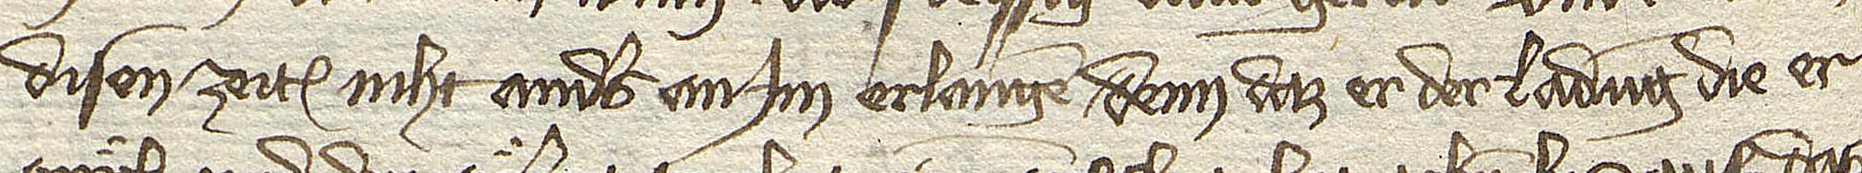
diſen ʒeit* niht and*s an Im erlange* / Denn daʒ er der ladu*g die er
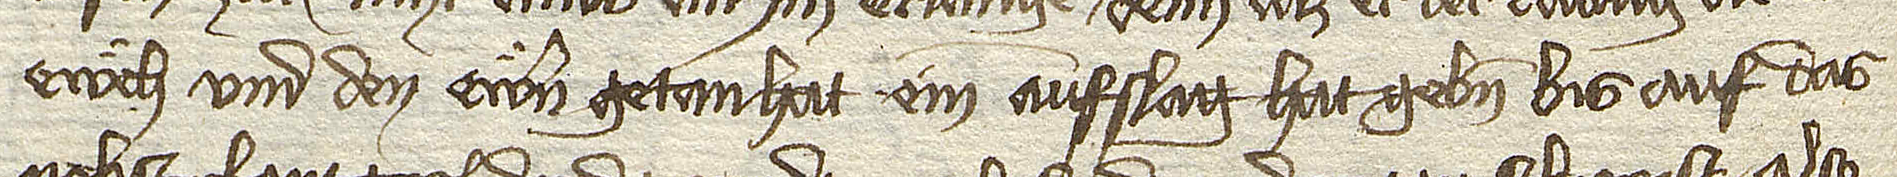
eẅch vnd den eẅ*n getan hat ein* aufſlag hat gebn* bis auf das
